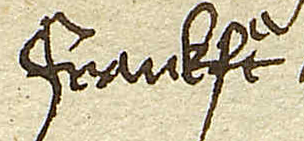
Frankf*t /
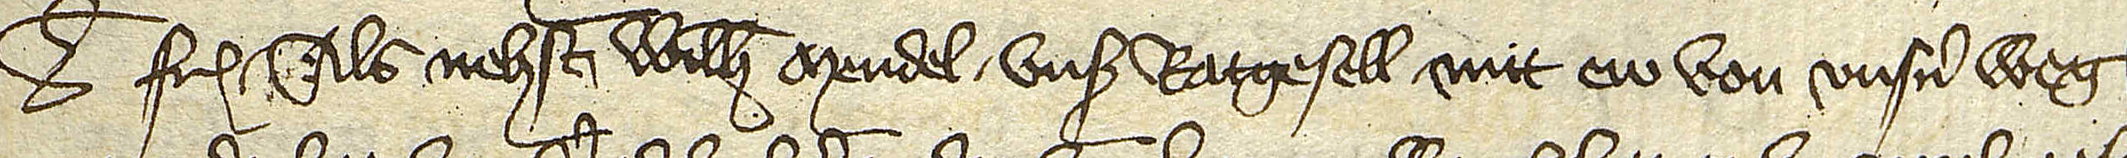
L* fr* / Als nehſt Wilh* Mendel / vnſ* Ratgeſell / mit ew von vnſn* weg*
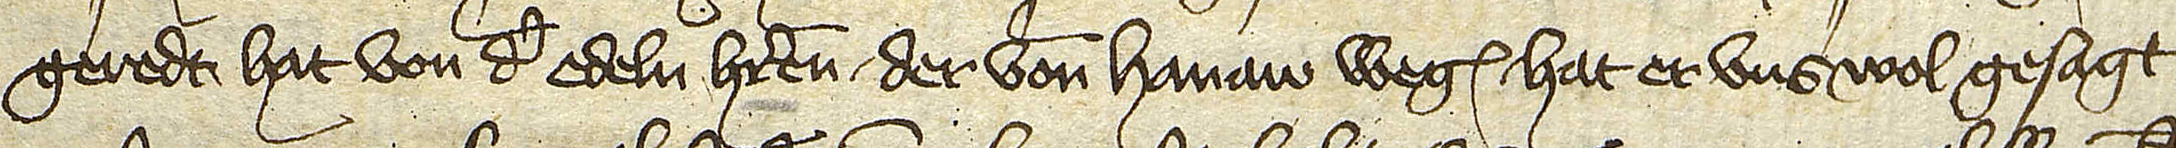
geredt hat von d* edeln hr*en / der von hanaw weg* / hat er vns wol geſagt
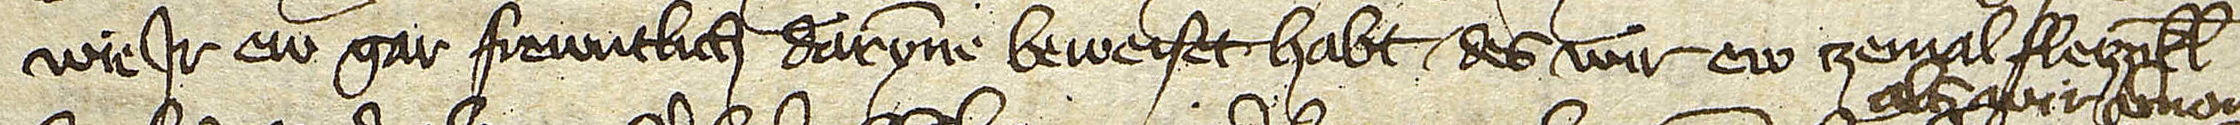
wie Ir ew gar frewntlich daryne* beweiſet habt / des wir ew cʒemal fleicʒʒikl*
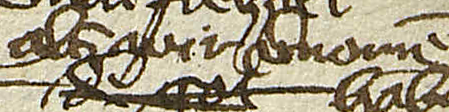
als wir v*nome*
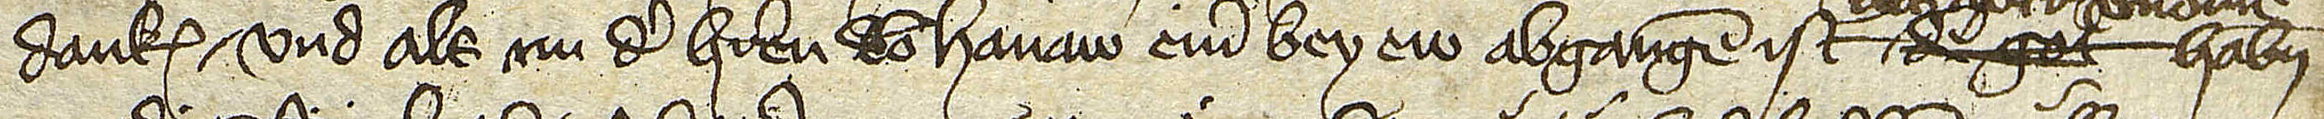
dank* / vnd als nu d* hr*en vo* hanaw ein* bey ew abgange* iſt / d* go habn*
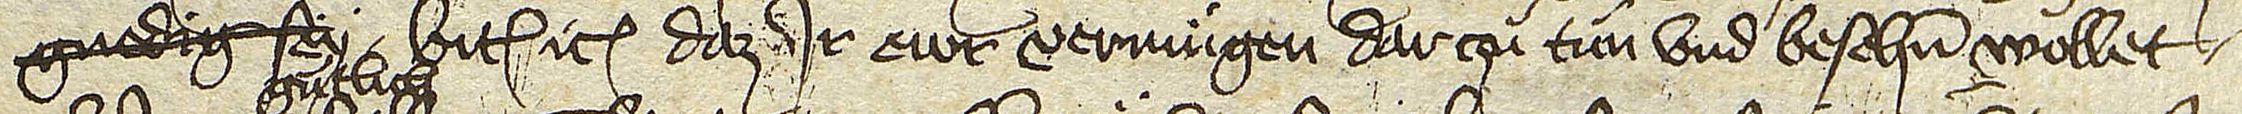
gnedig ſey bit* ec* daʒ Ir ew vermügen dar cʒü tün vnd beſehn* wöllet /
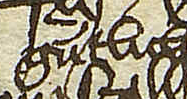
gütlich
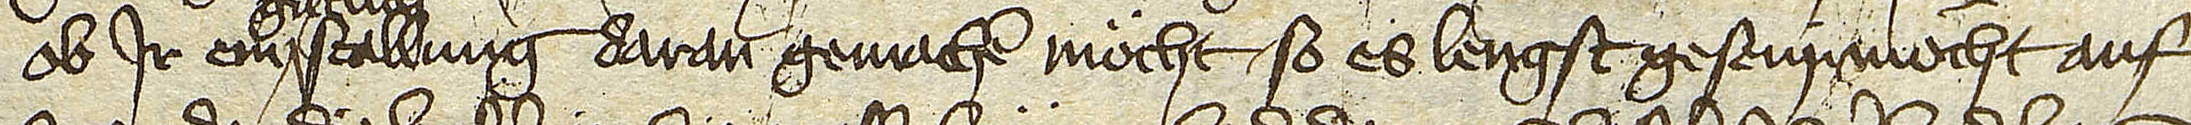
ob Ir ein ſtallung daran gemache* möcht / ſo es lengſt geſein möcht auf
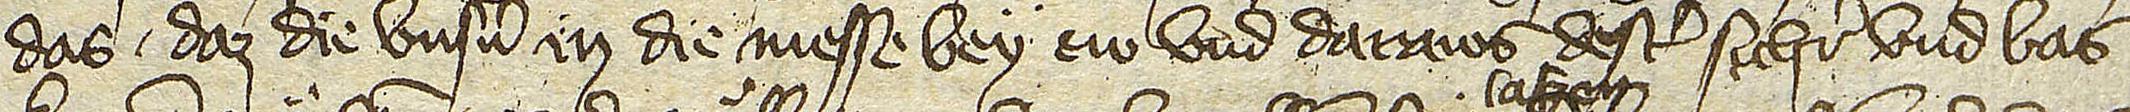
das / daʒ die vnſn* in die meſſe bey ew vnd daraws deſt* ſichr* vnd bas
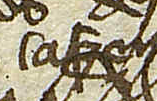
laſʒen
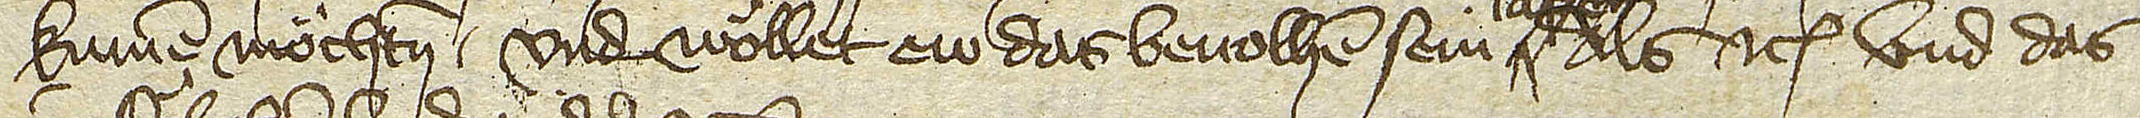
kume* möchtn* / vnd wöllet ew das beuolhe* ſein / als ec* vnd das
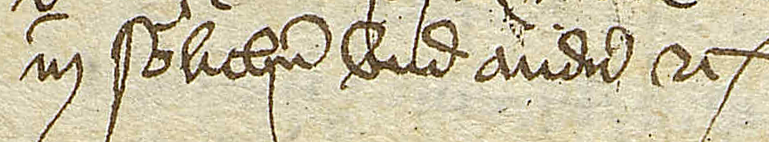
in* ſölichn* vnd andn* ec*
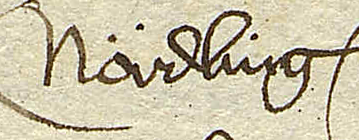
Nördling*
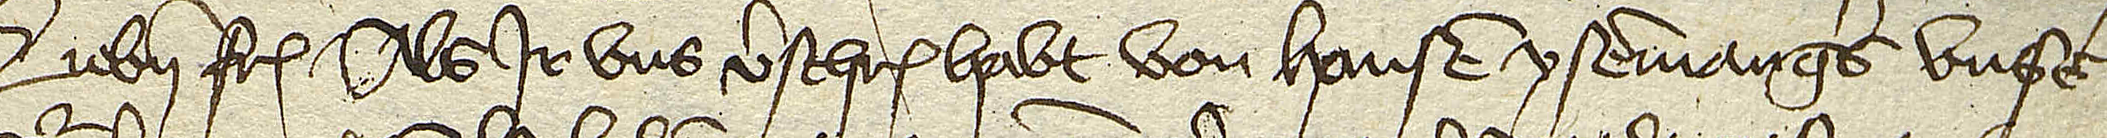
Liebn* fr* / Als Ir vns v*ſchr* habt von hanſe* yſe*mangs* vnſs*
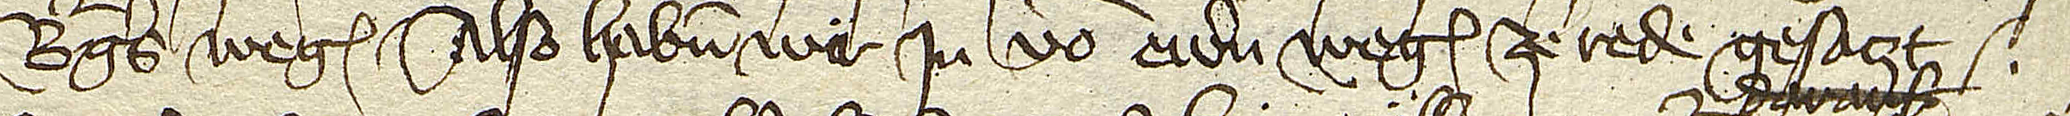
B*g*s weg* / Alſo habn* wir In vo* ew*n weg* cʒe rede geſacʒt / .
